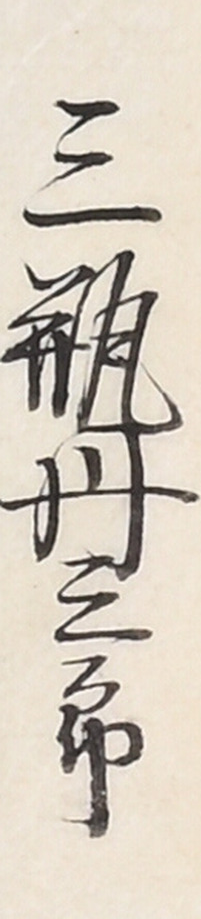三瓶丹三郎
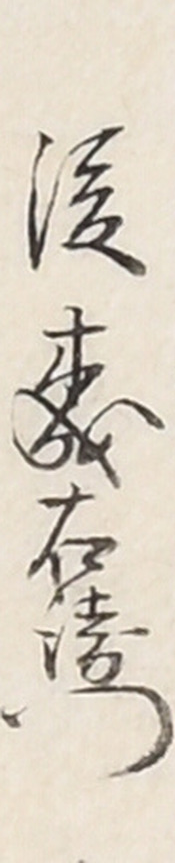後森右衛門
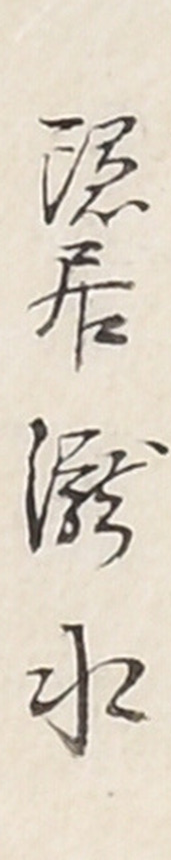隠居瀧水
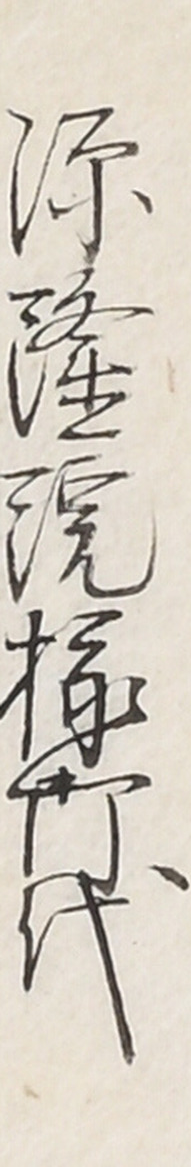源隆院様御代
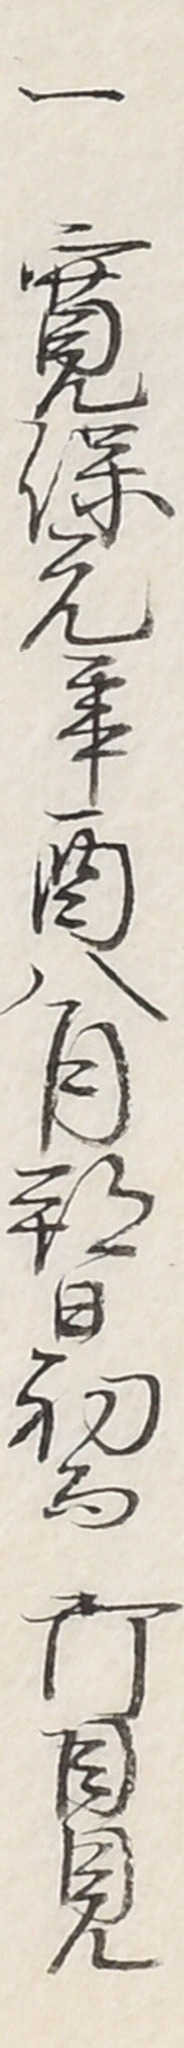一寛保元年酉八月朔日初而御目見
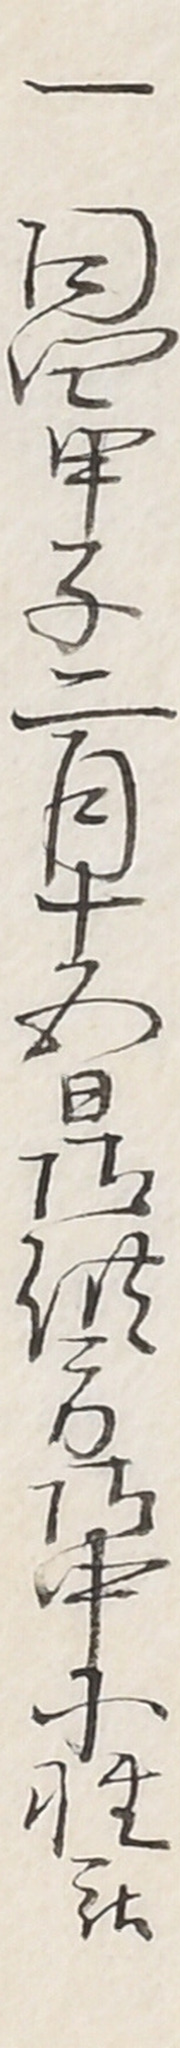一同四甲子二月十五日御供方御中小姓被
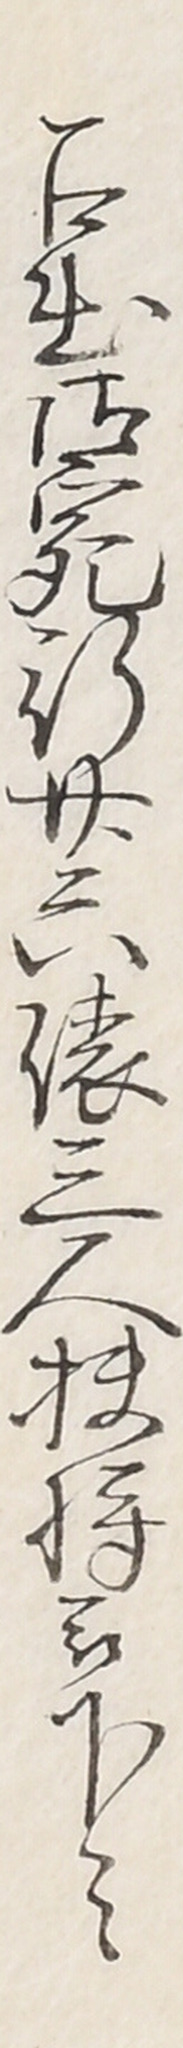召出御宛行廿六俵三人扶持被下之
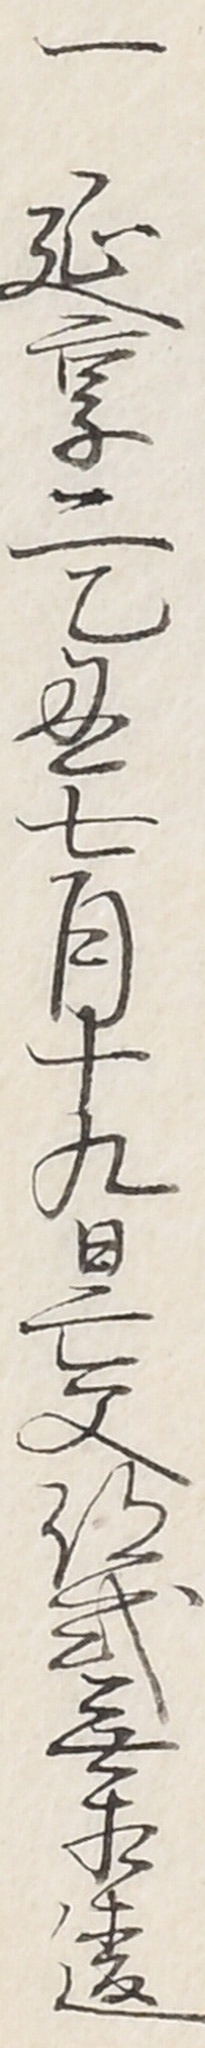一延享二乙丑七月十九日亡父跡式無相違
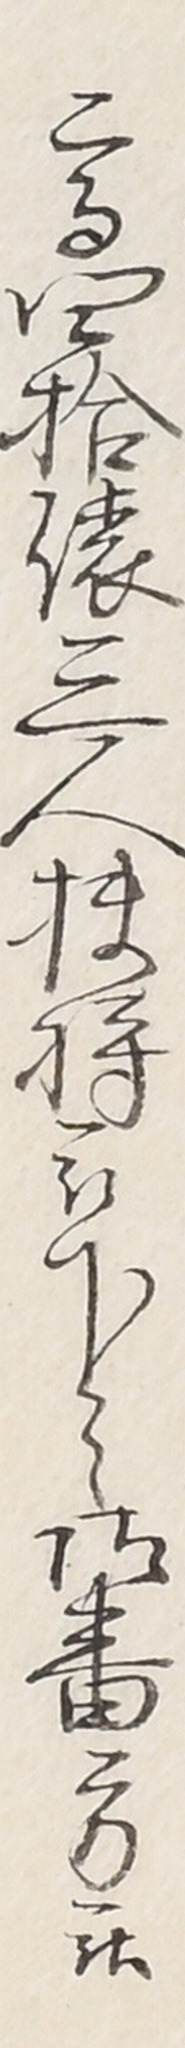高四拾俵三人扶持被下之御番方被
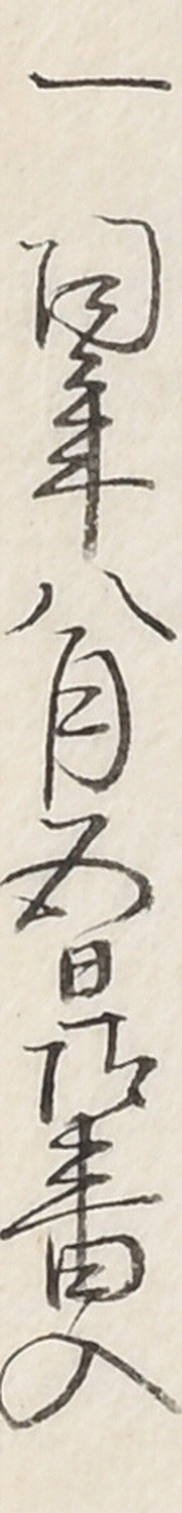一同年八月五日御番入
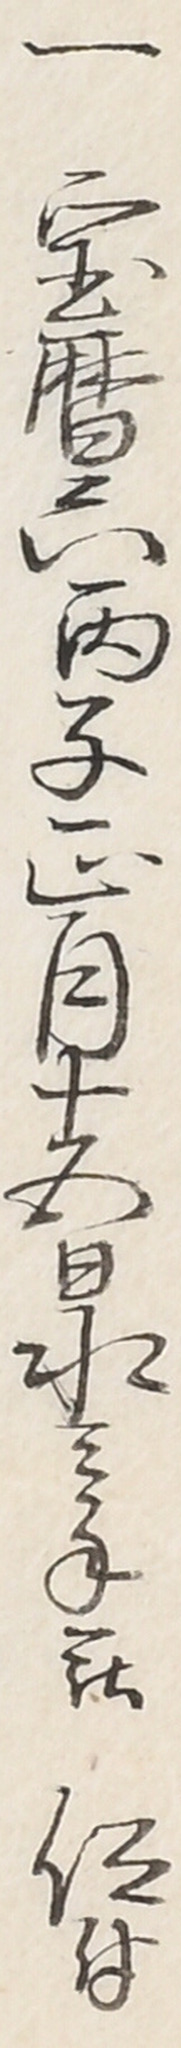一宝暦六丙子正月十五日水之手被仰付
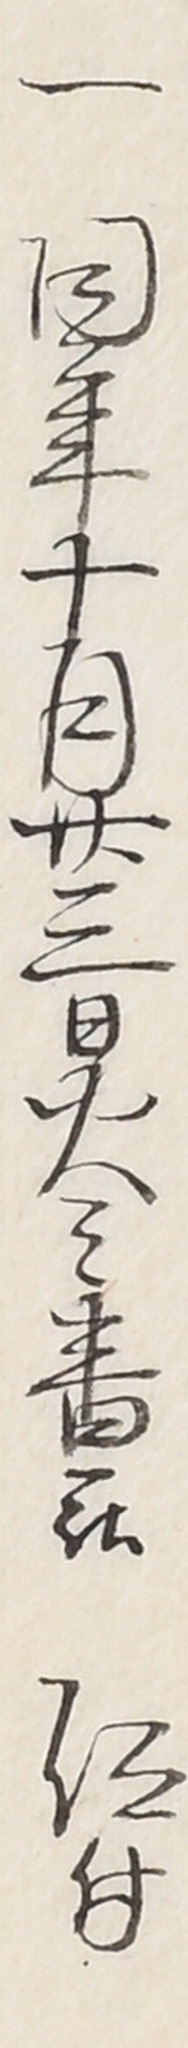一同年十月廿三日火之番被仰付
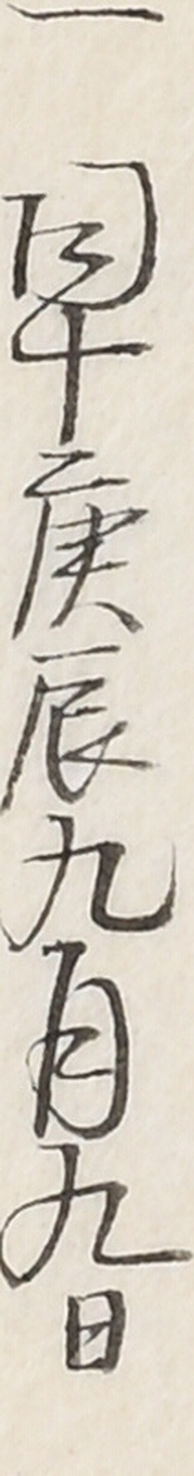一同十庚辰九月九日
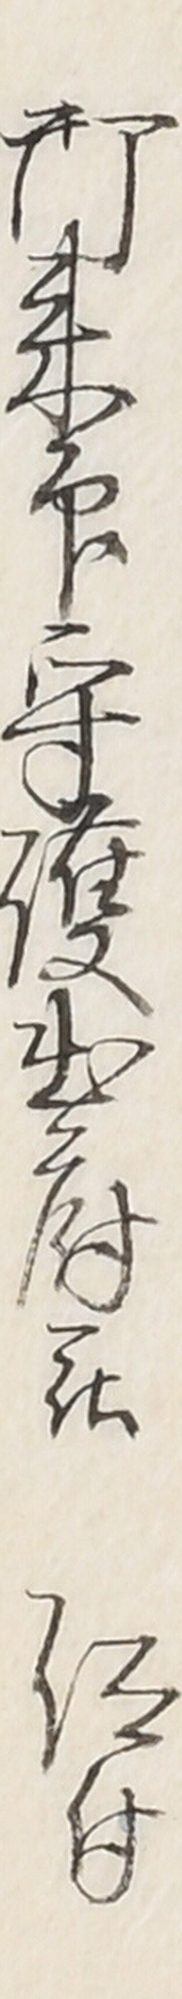御朱印守護出府被仰付
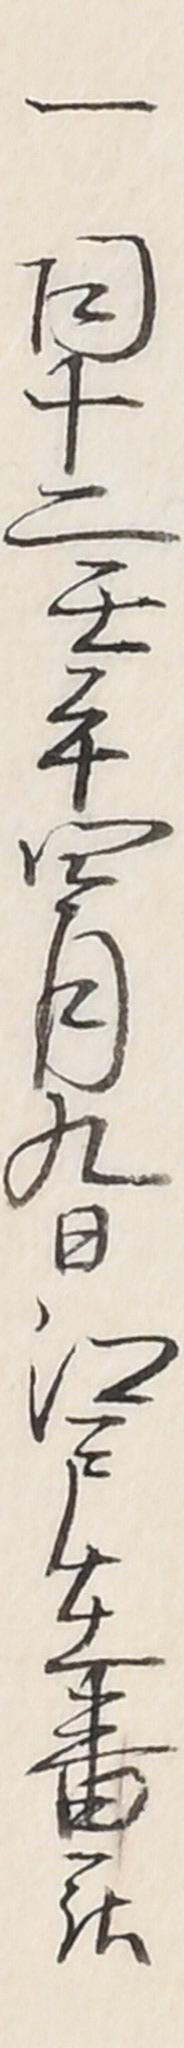一同十二壬午四月九日江戸在番被
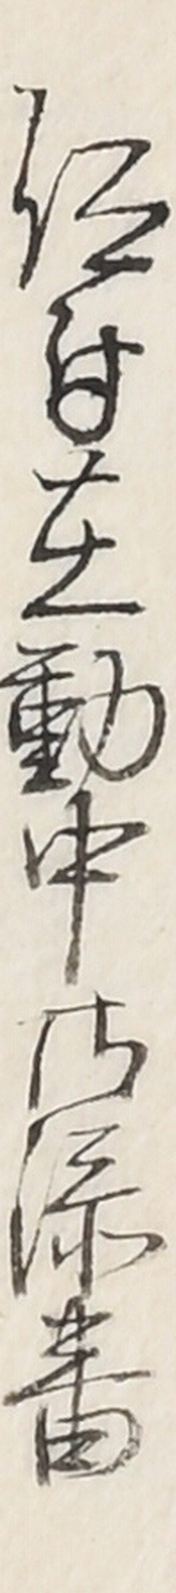仰付在勤中御添番
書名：給人諸士勤仕録（七）
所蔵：伊那市立高遠町図書館・合同会社AMANE
